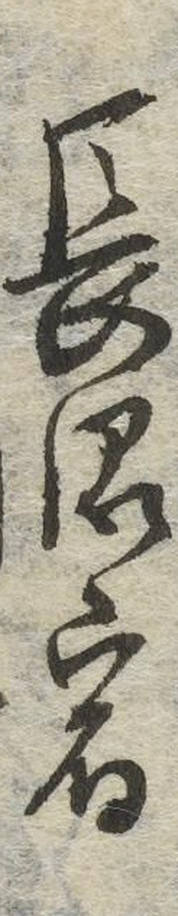長沼宿
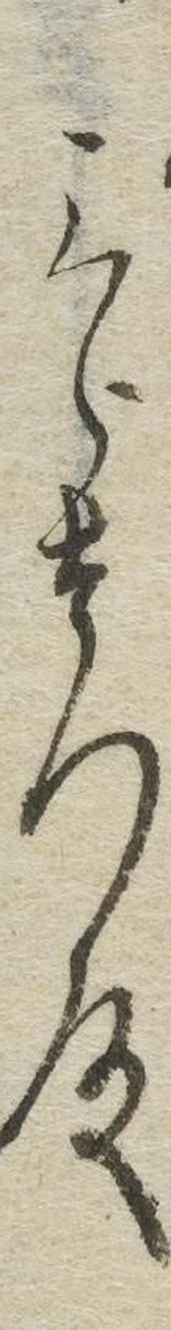三郎衛門殿
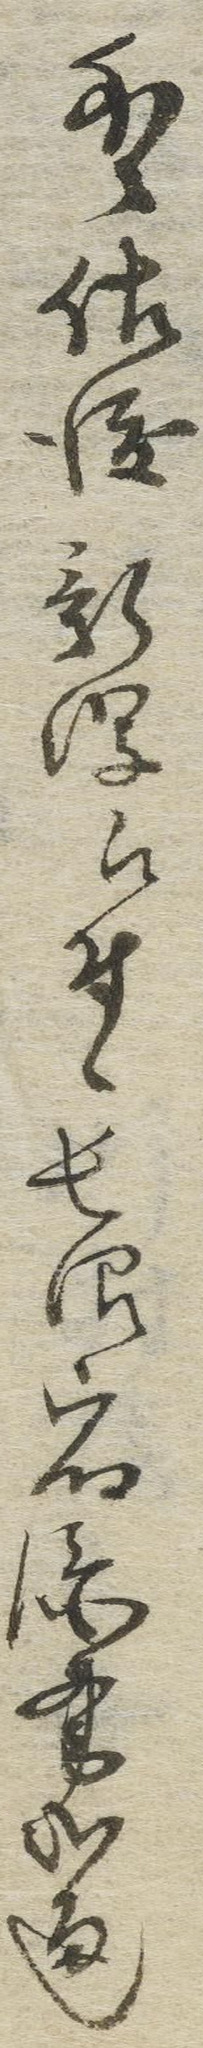再々佐渡新潟江付候長沼宿添書弐通
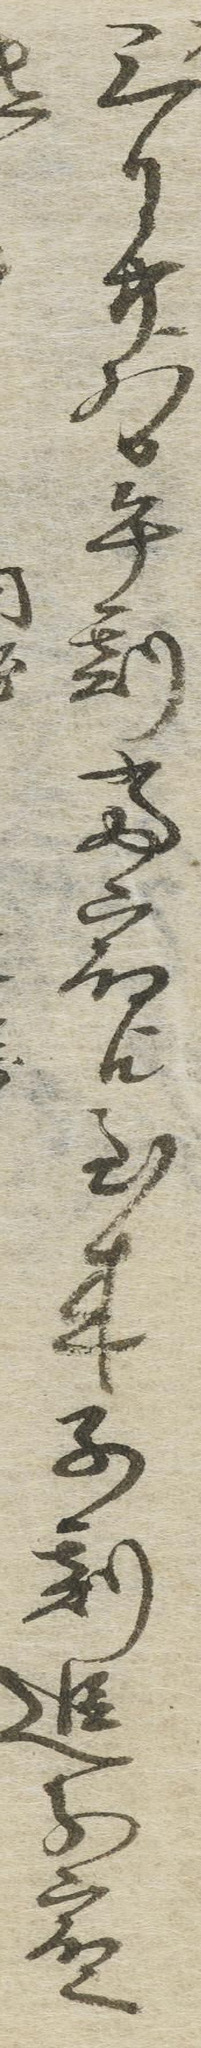右三月廿八日午刻当宿江到来子刻追分宿へ
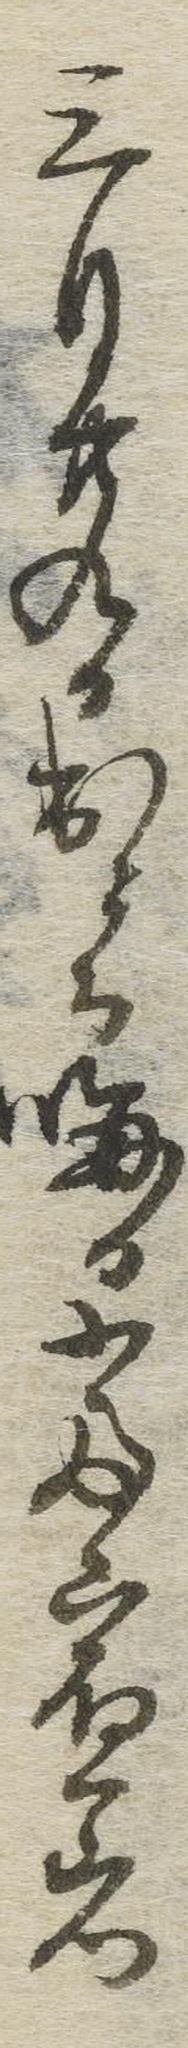三月廿九日出二而晦日当宿着
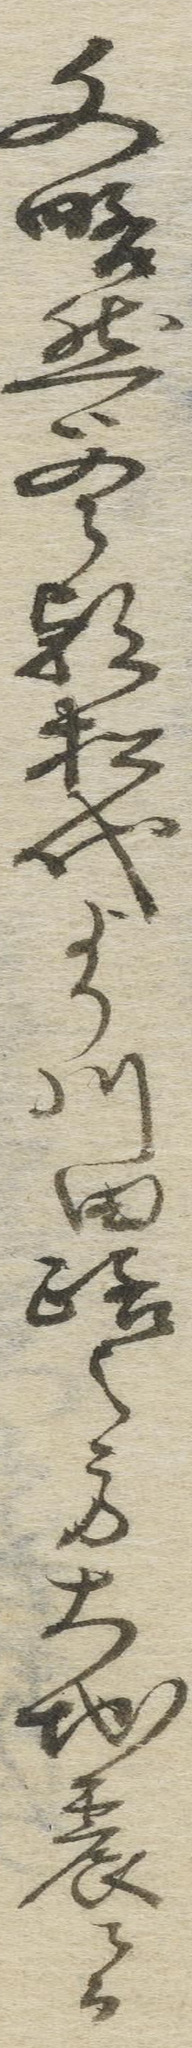文略然ハ今朝松代より河田路之方大地震二而
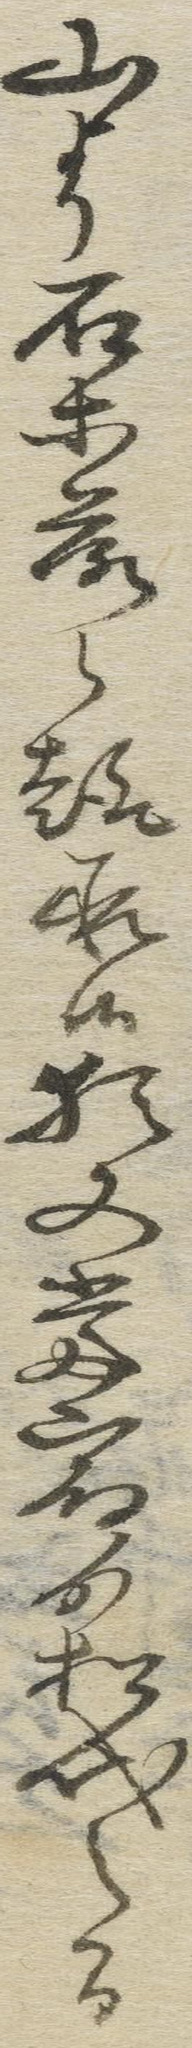山より石等崩落候趣承候猶又当宿ゟ松代之間
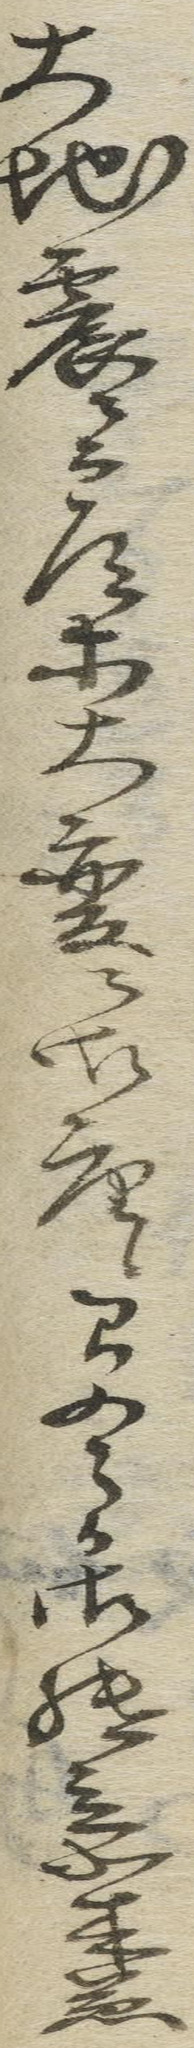大地震二而道等大変二御座候間今日御継立出来兼
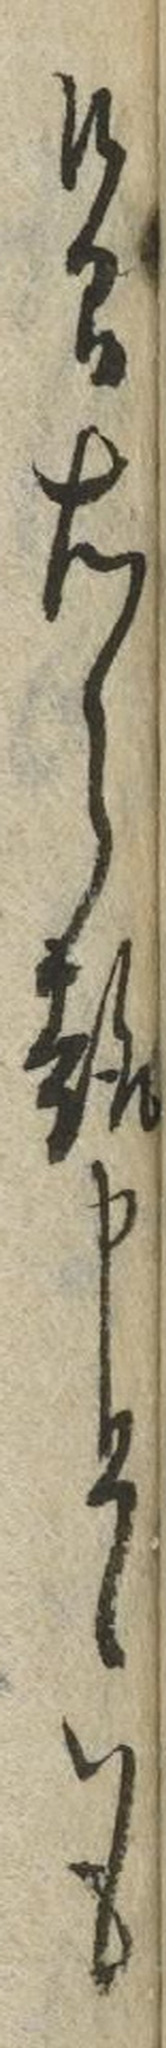候間右之趣申上候以上
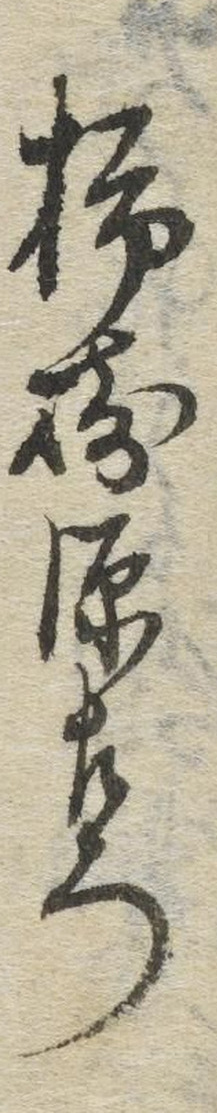柿崎源右衛門
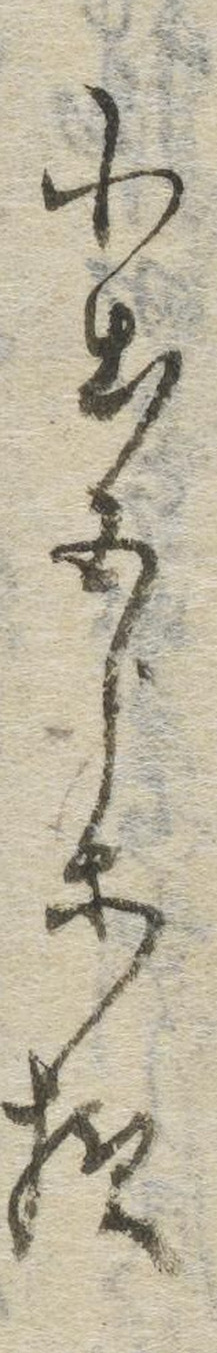小出五郎兵衛様
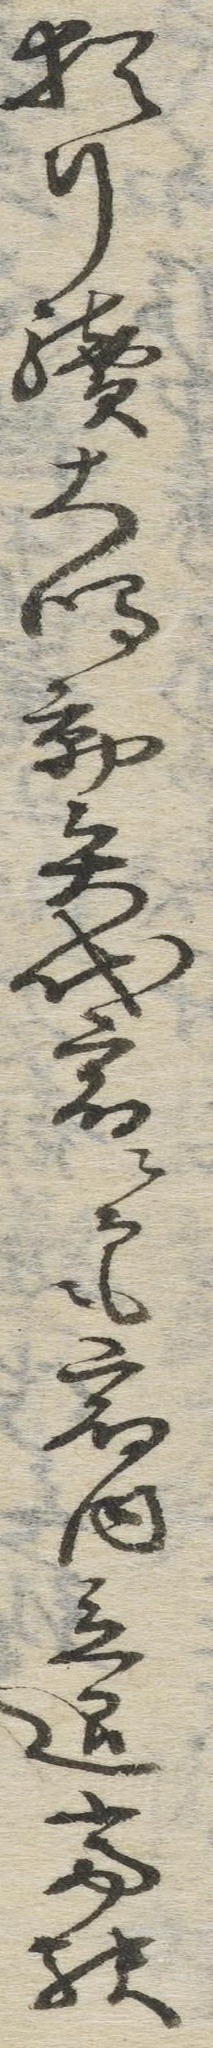猶引続大鳴動矢代宿二而も宿内立退当駅
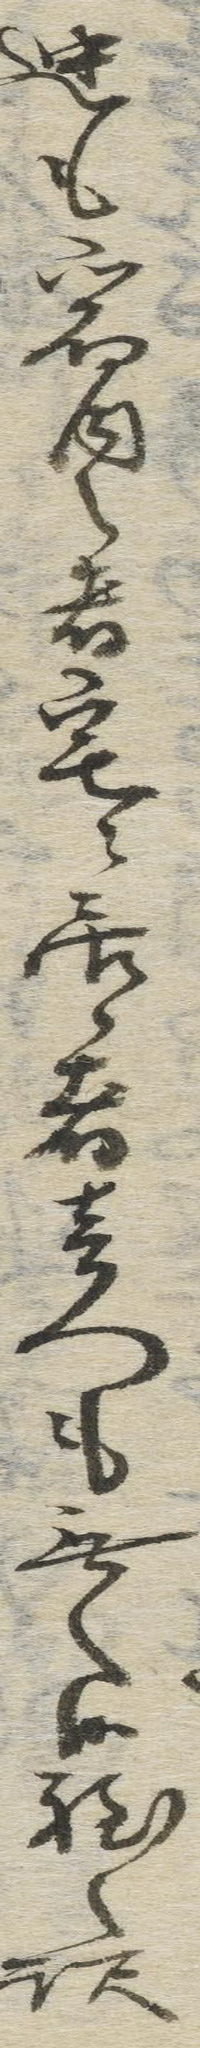迚も宿内之者宅二居候者壱人も無之程之訳
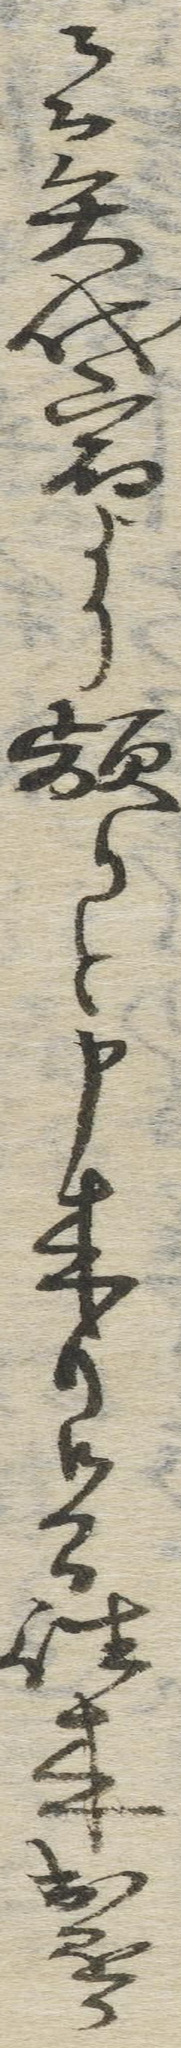二而矢代宿より頻りと申来り候間往来出懸り
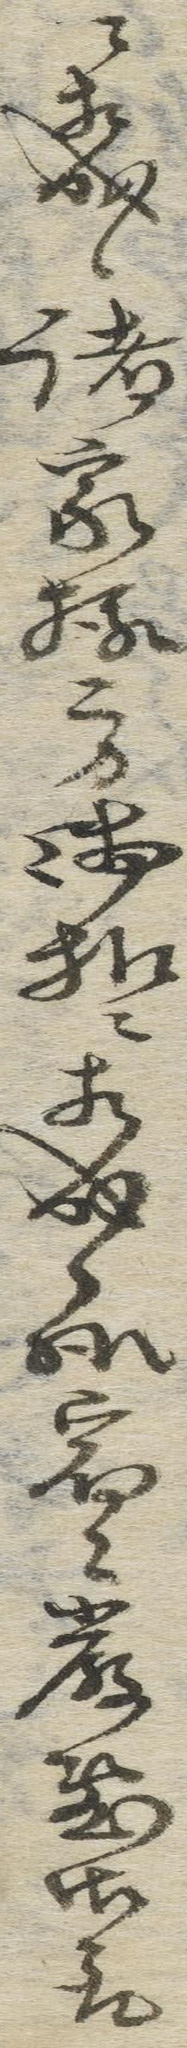二相成候諸家様方暇扣二相成候様宿々厳敷御取
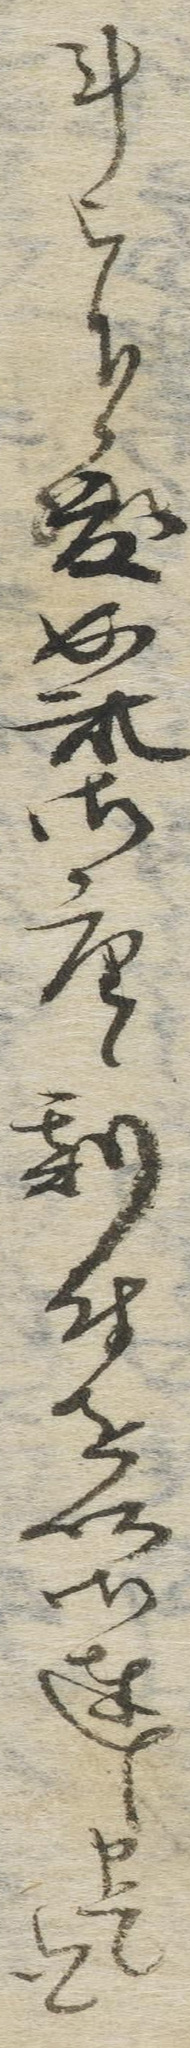計被下候処如此御座候刻付を以御達し申上候以上
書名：信濃越後　地震書留
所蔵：東京大学地震研究所図書室 Earthquake Research Institute Library, The University of Tokyo, JAPAN
